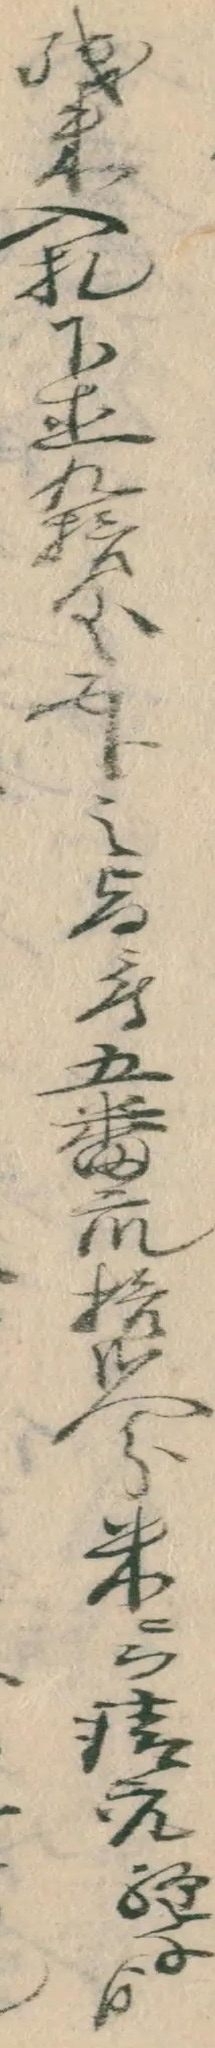残来入札下直九拾匁五分之旨ニ付五番衆拾弐人分米ニ而請取経千ゟ
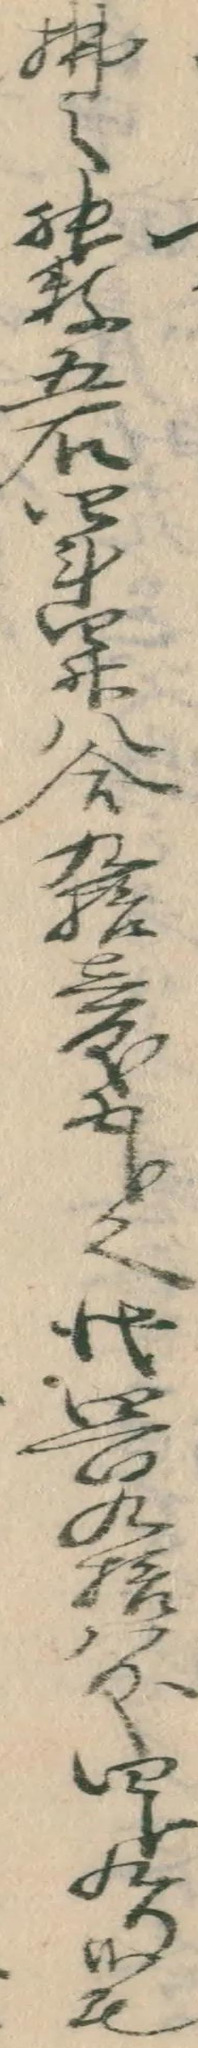払之神数五石四斗四升八合九拾三匁五分之代四百九拾八匁四分九り弐毛
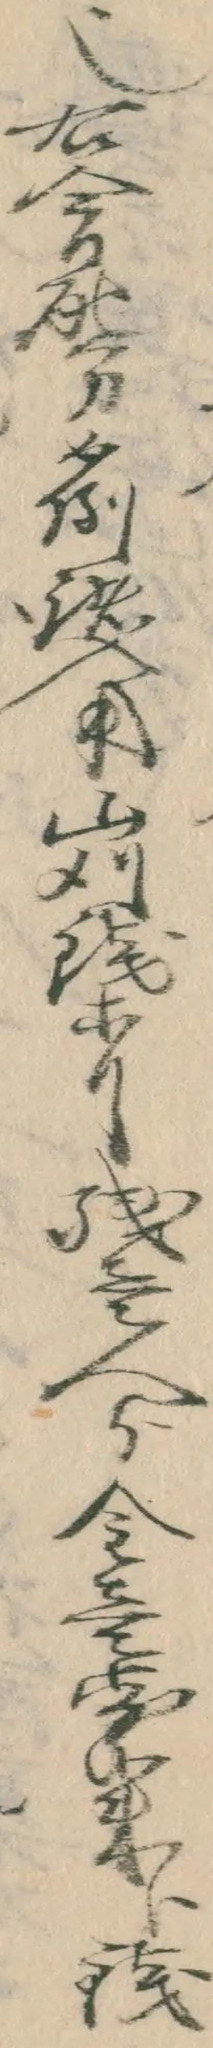也右今日職方不例認入用山刈銭等引残壱人分金壱歩弐朱ト銭
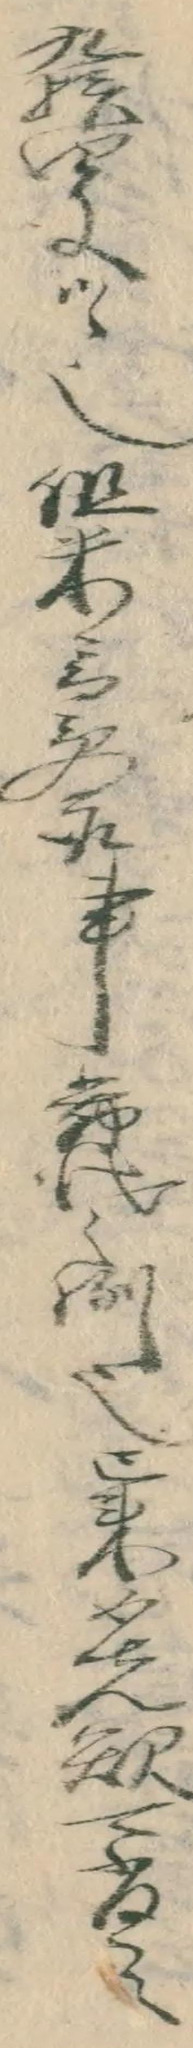九拾四文ツヽ也但米ニ而受取事希代之例也已来如先規可有之
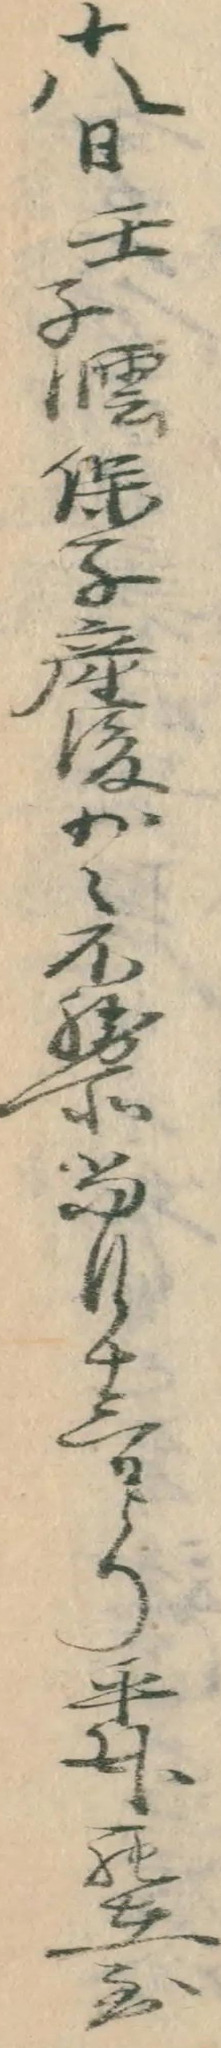十八日壬子曇保子産後少々不勝所當月十三日より平井罷在至

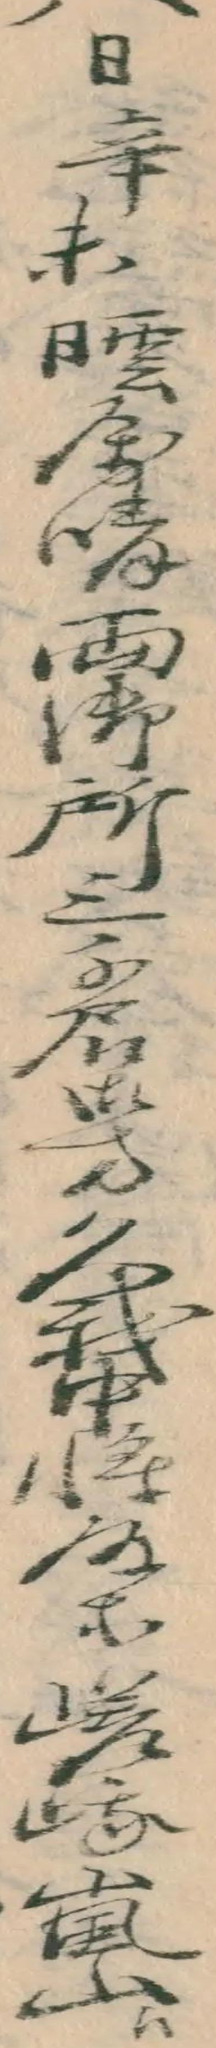八日辛未曇属晴両御所三千居御方久我中将殿等嵯峨嵐山え
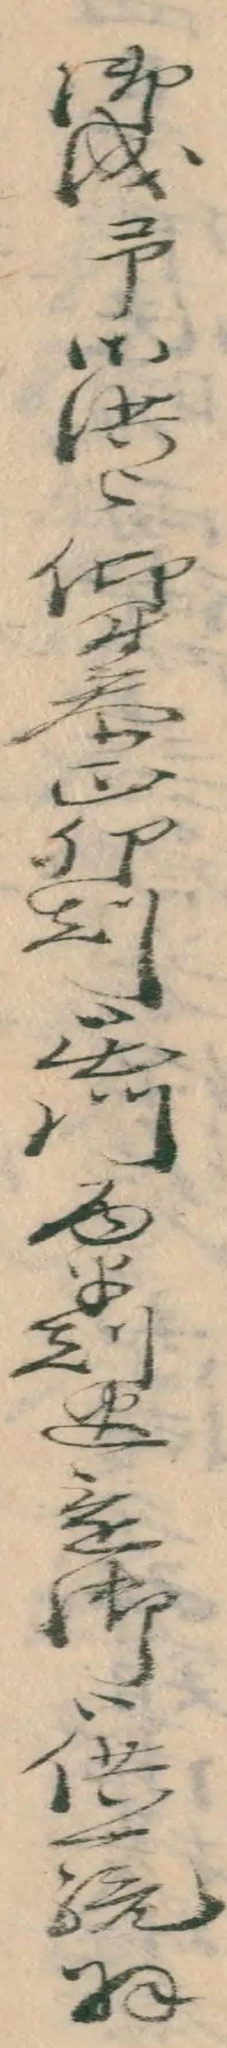御成予御供被仰付参正卯刻御出門酉半刻過還御御供一統羽
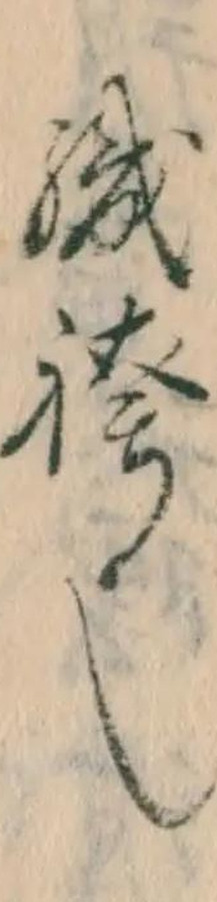織袴也
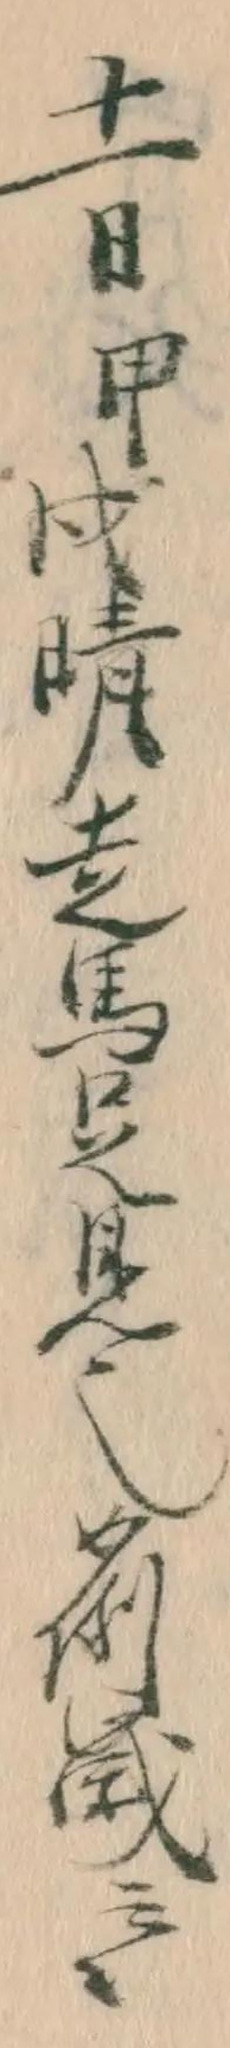十一日甲戌晴走馬足見也如例歳云々
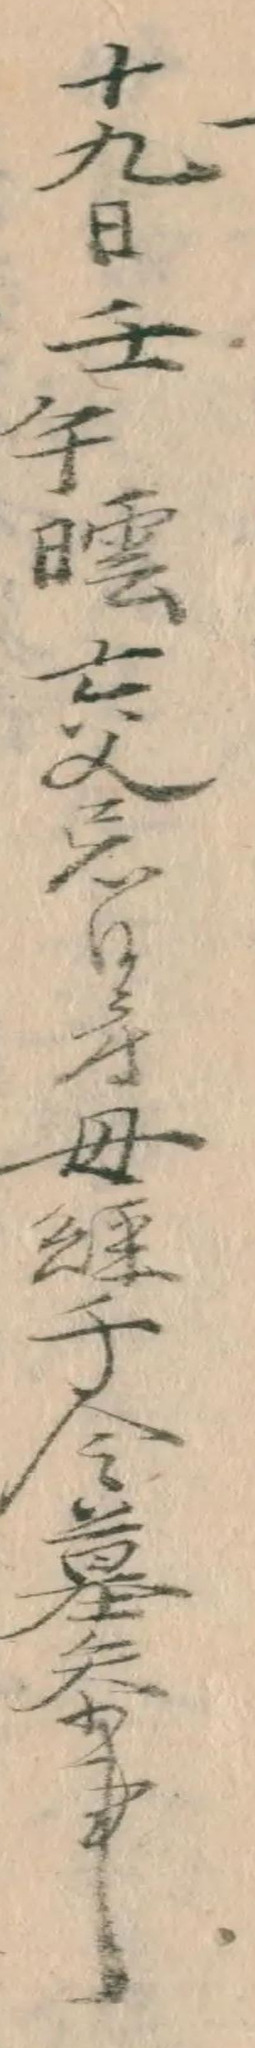十九日壬午曇亡父忌日ニ付母経千令墓参事
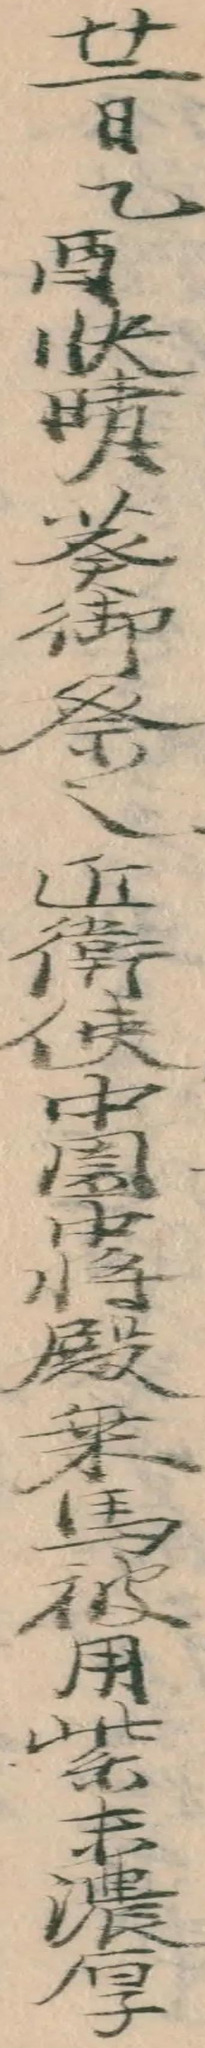廿一日乙酉快晴葵御祭也近衛使中園中将殿乗馬被用紫末濃厚
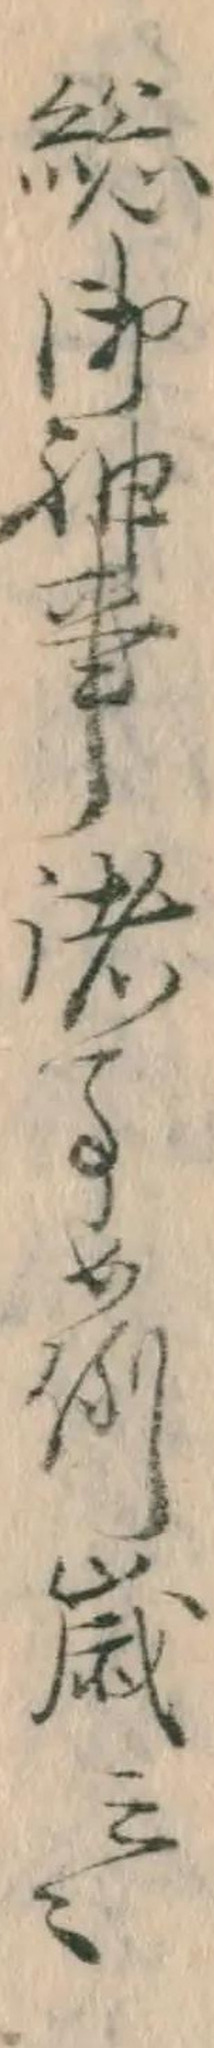総御神事諸事如例歳云々
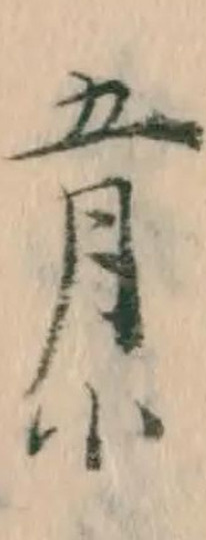五月小
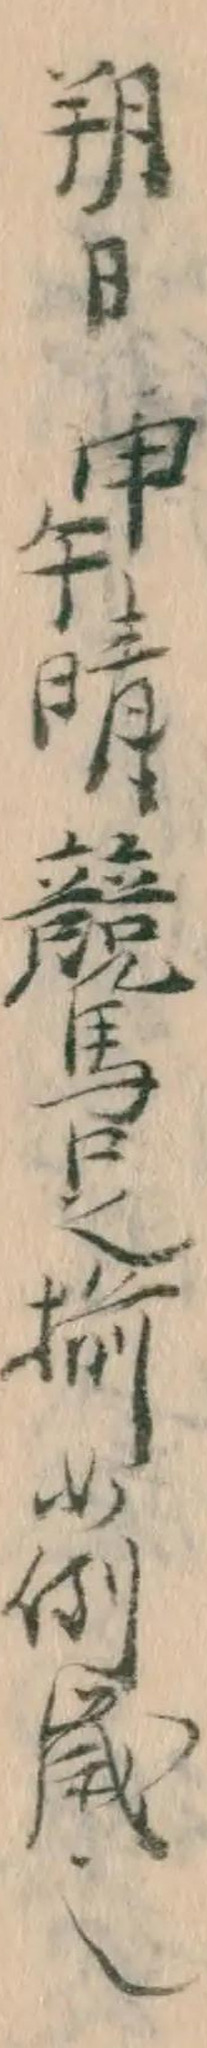朔日甲午晴競馬足揃如例歳也
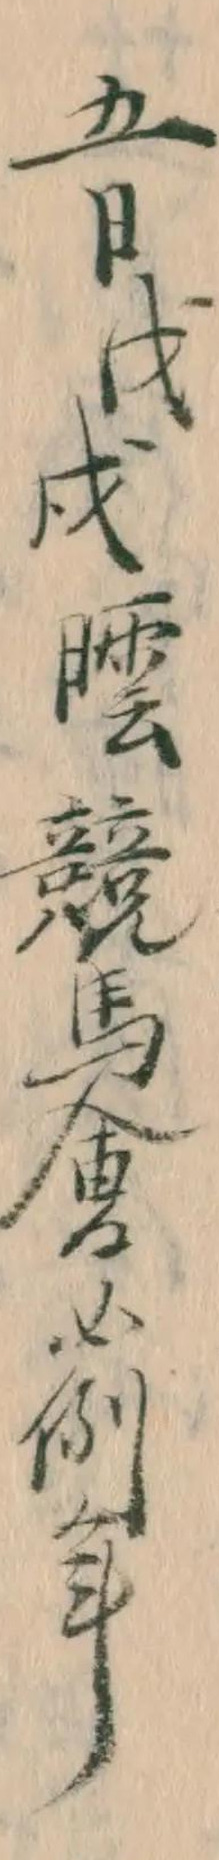五日戊戌曇競馬會如例年
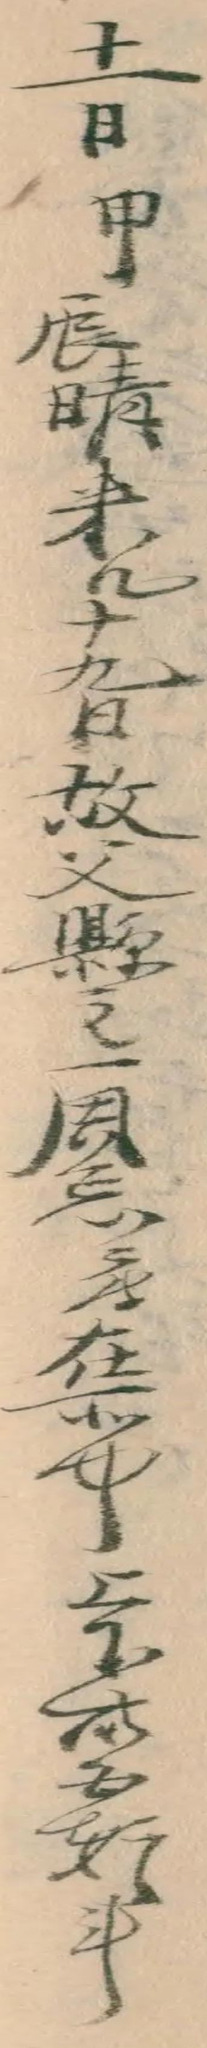十一日甲辰晴来ル十九日故父縣主一周忌ニ付在所中上下卅五軒斗
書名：賀茂社記録. 第65冊
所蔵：国立国会図書館 National Diet Library, JAPAN
